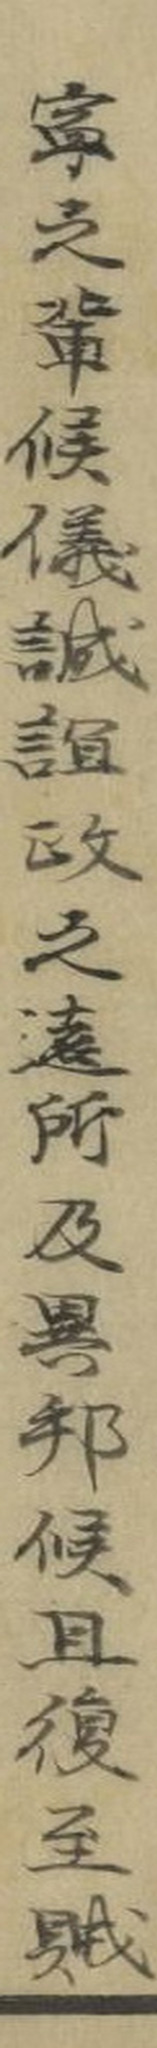寧之輩候儀誠誼政之遠所及異邦候且至賊
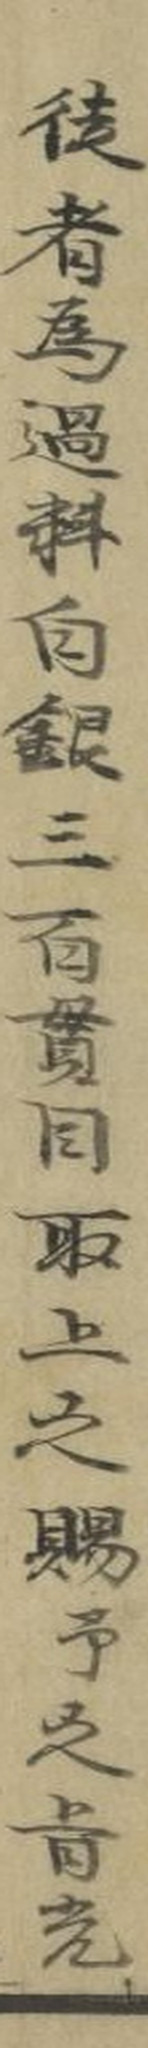使者為過料白銀三百貫目取上之賜予之旨光
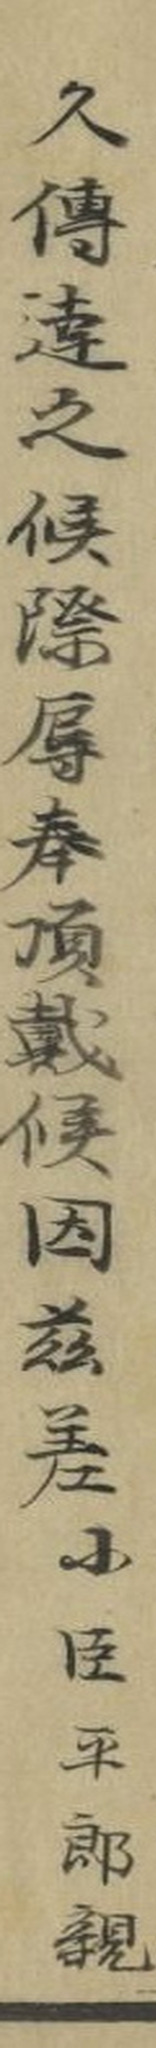久伝達之候際辱奉頂戴候因茲差小臣平郎親
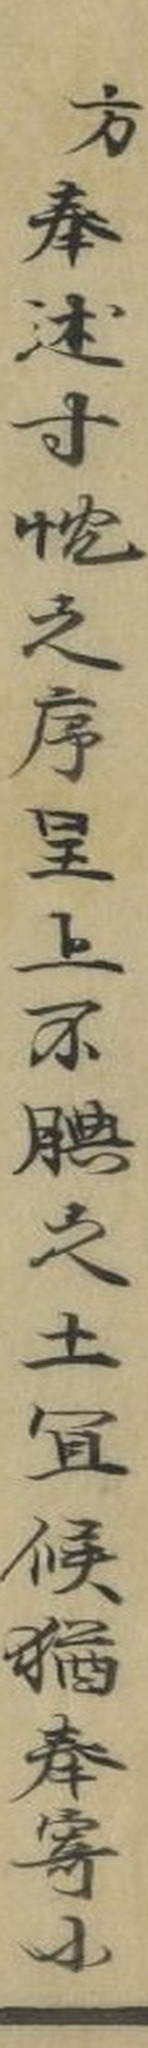方奉述寸參之序呈上不腆之土冝候猶奉寄小
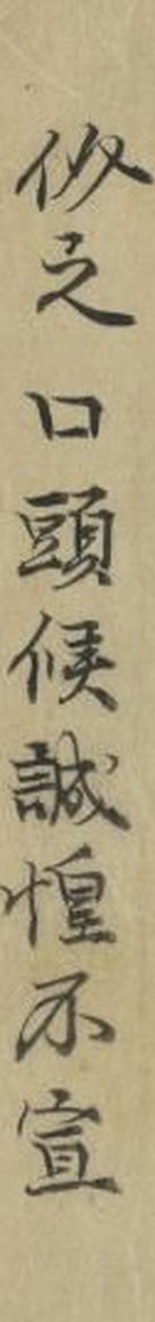价之口頭候誠惶不宣
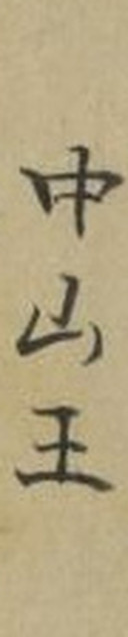中山王
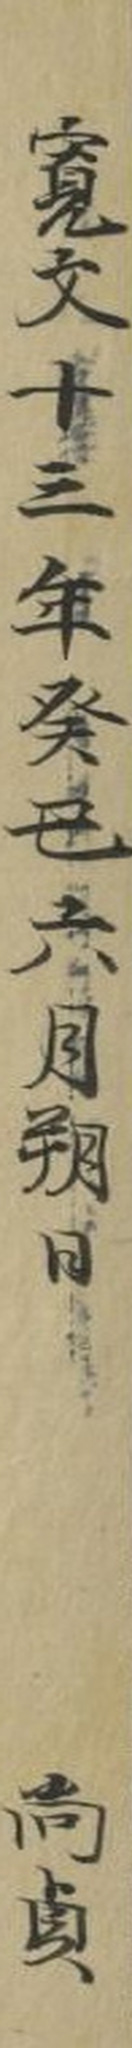寛文十三年癸丑六月朔日尚貞
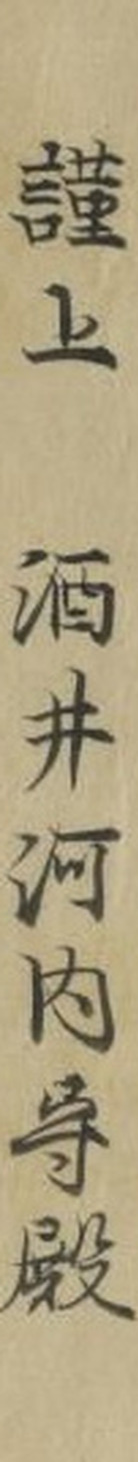謹上酒井河内守殿
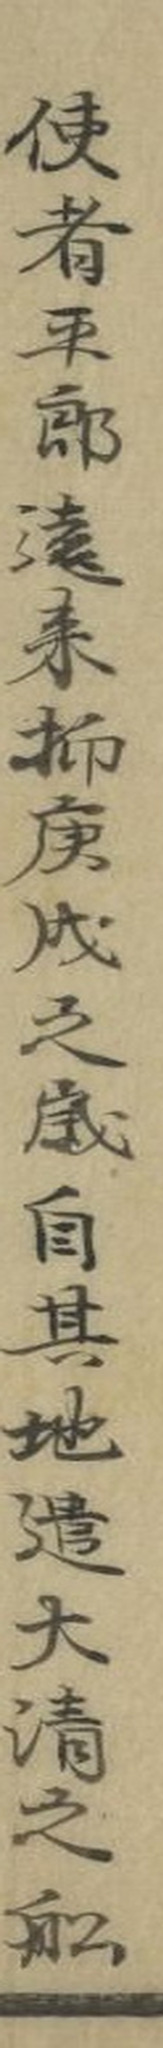使者平郎遠来抑庚戌之歳自其地遣大清之舩
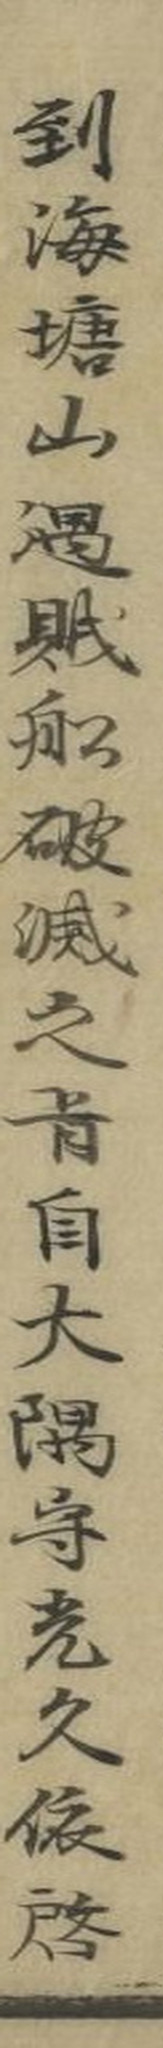到海塘山遇賊舩破滅之旨自大隅守光久依啓
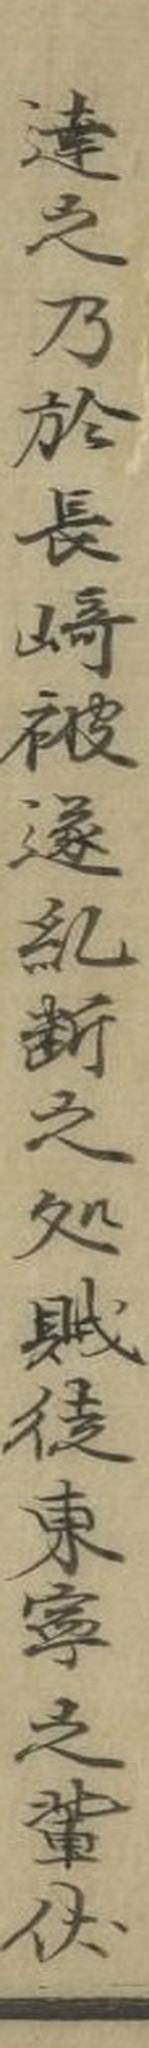達之乃於長崎被遂糺断之処賊徒東寧之輩伏
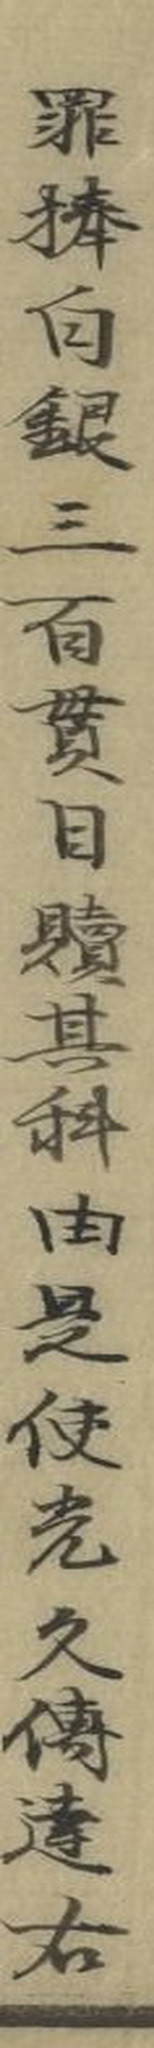罪捧白銀三百貫目贖其科由是使光久伝達右
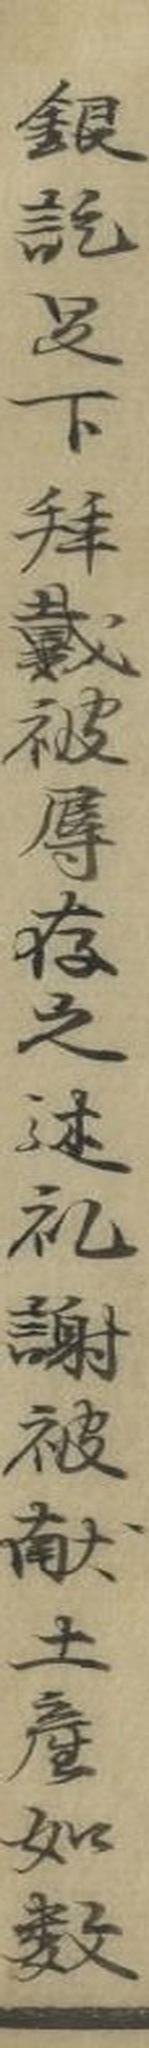銀記足下拝載被辱存之述礼謝被献土産如数
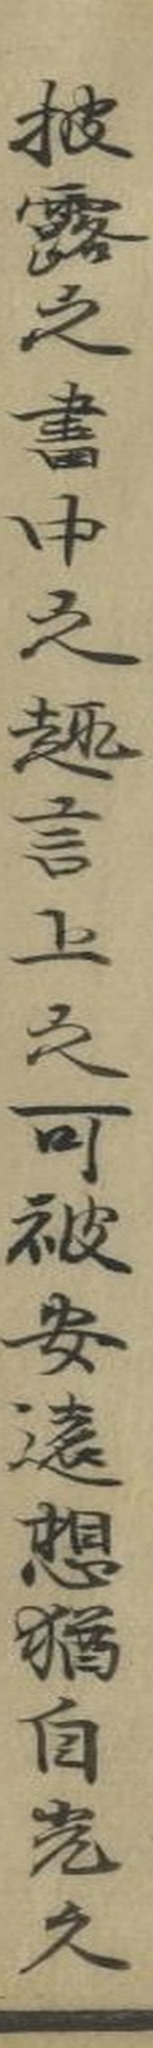披露之書中之趣言上之可被安遠想猶自光久

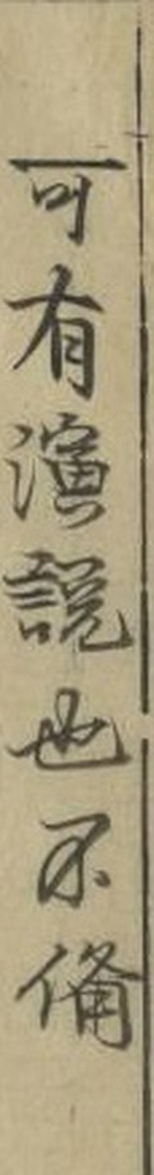可有演説也不備
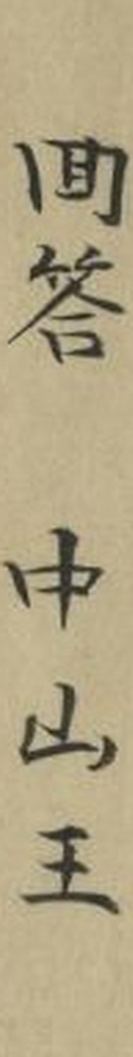回答中山王
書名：琉球往来（下）
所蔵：University of the Ryukyus Library
